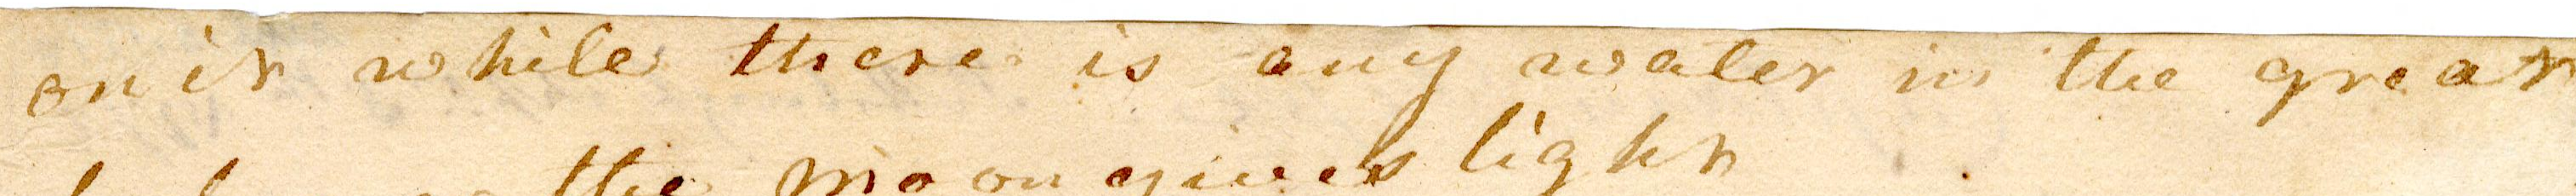over while there is any water in the great
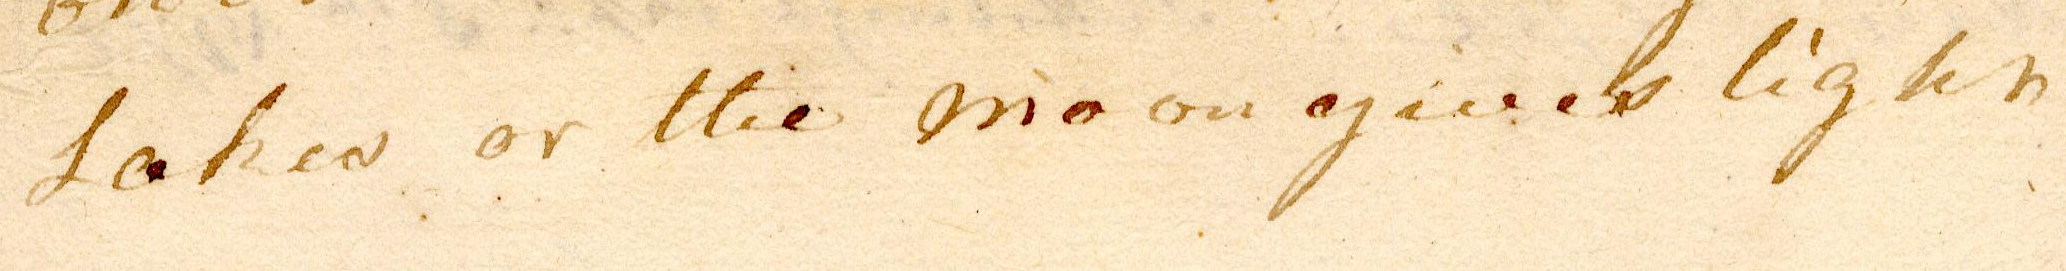Lakes or the moon gives light
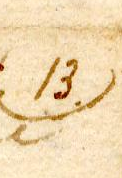13.
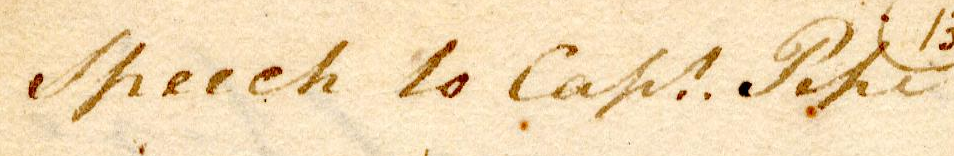Speech to Cap^t. Pipe
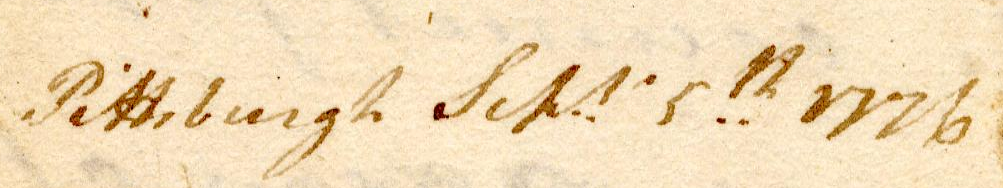Pittsburgh Sep^r. 5^th. 1776
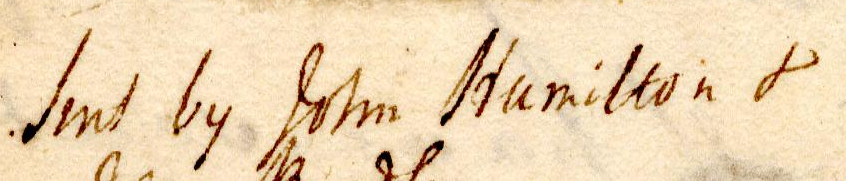Sent by John Hamilton &
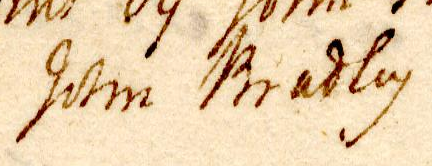John Bradley.
